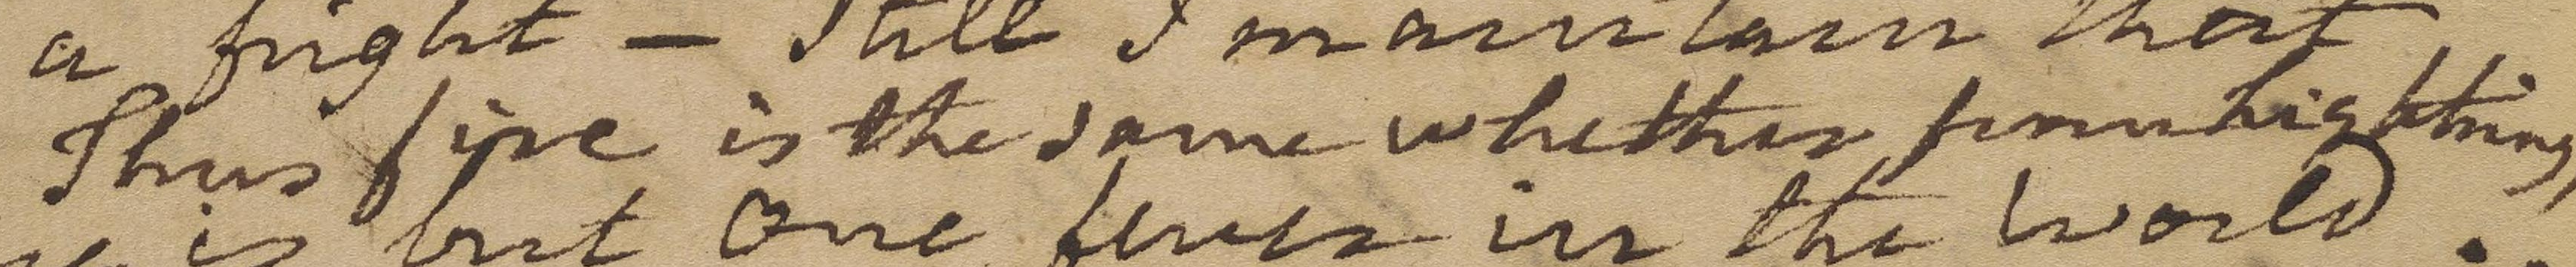This fire is the same whether from lightning,
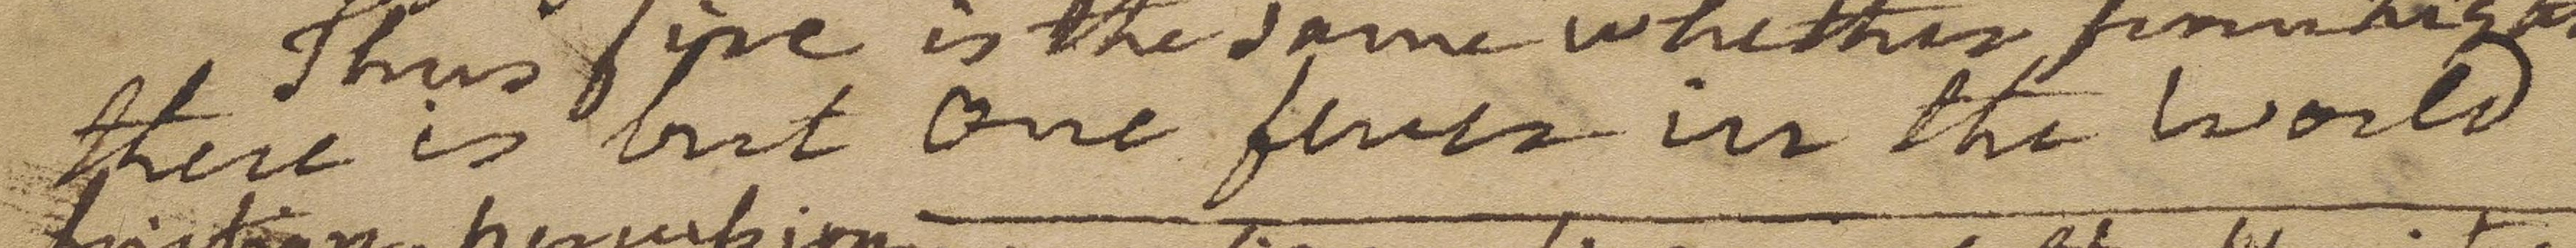there is but one fever in the world
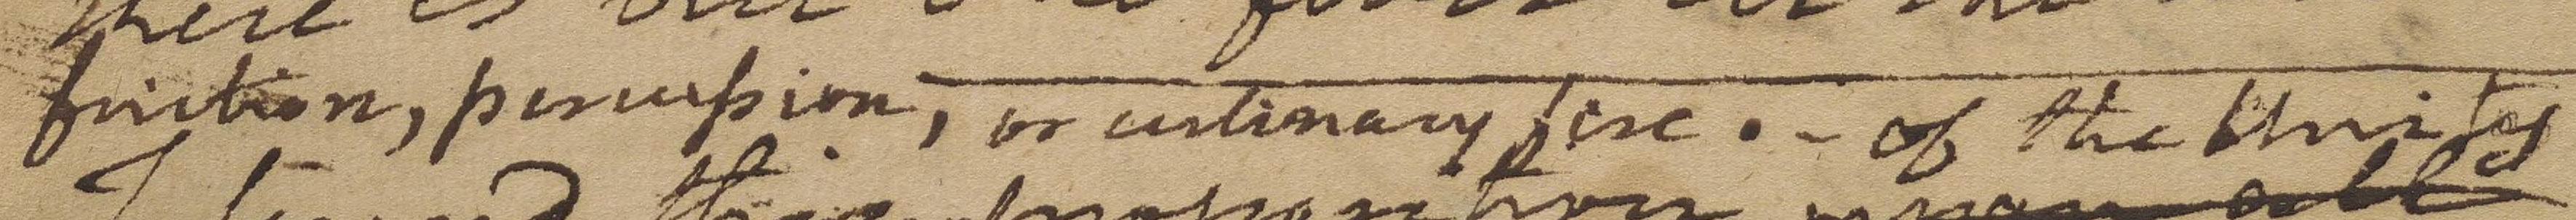friction, percession, or ordinary fire. of the unity
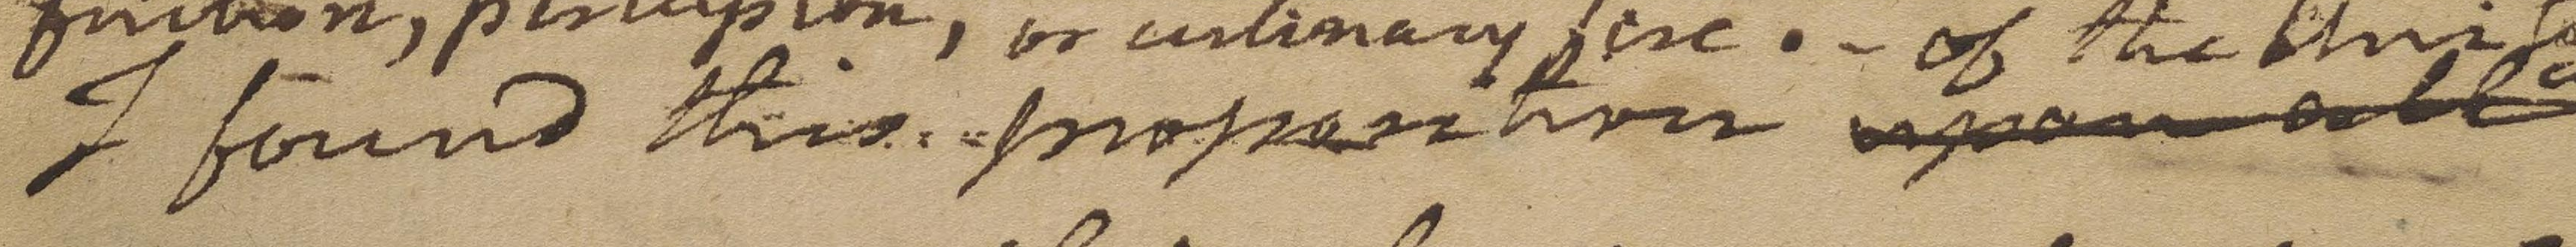I found this proposition [upon all]
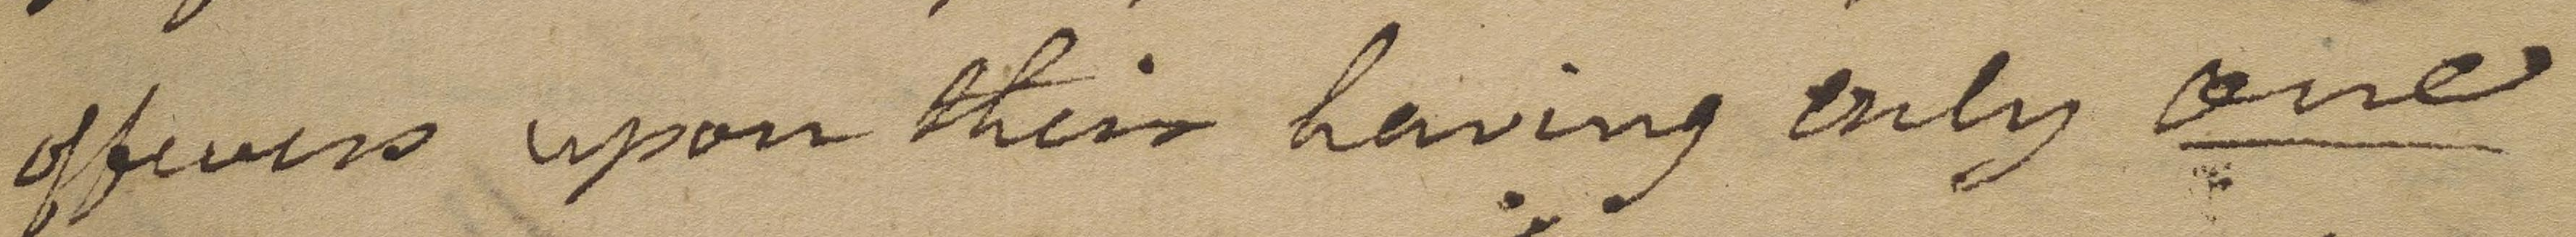of fevers upon their having only one
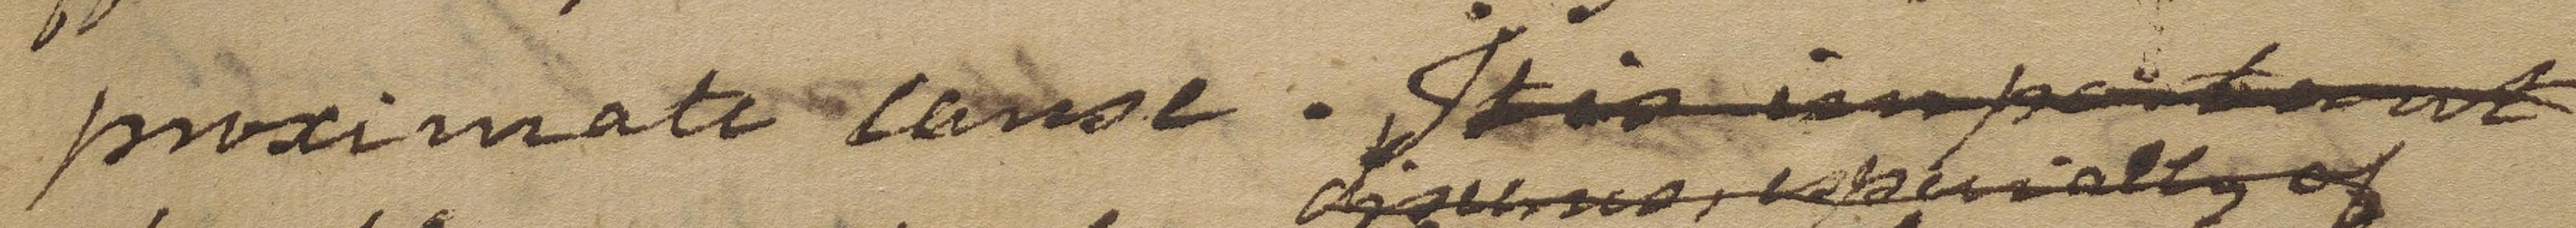proximate cause. [It is important]
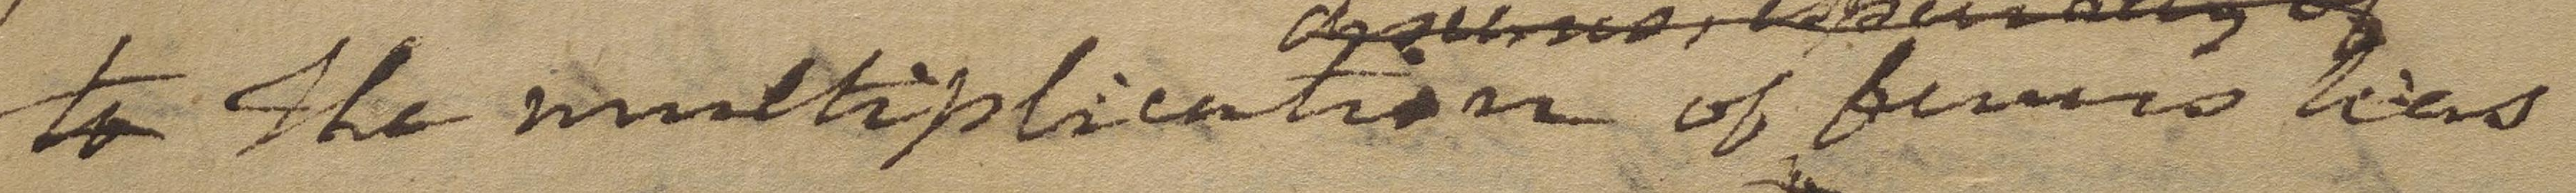to the multiplication of fevers was
